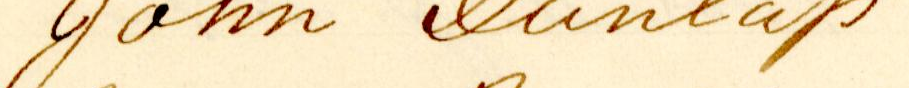John Dunlap
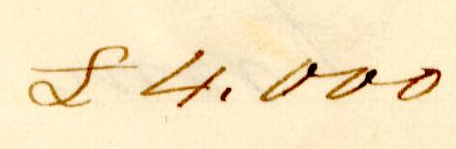£4,000
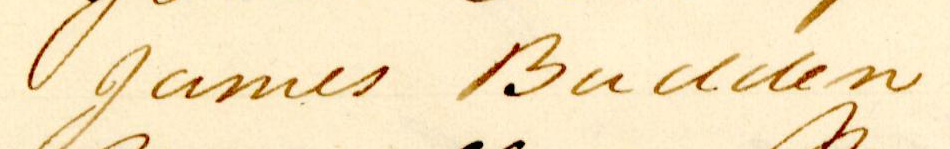James Budden
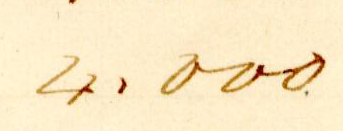4,000
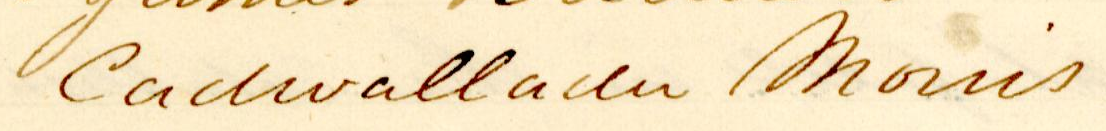Cadwallader Morris
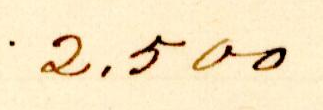2,500
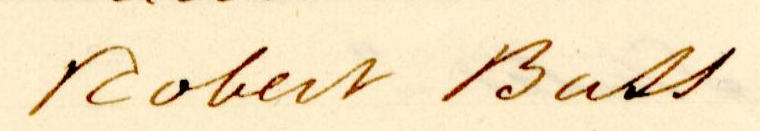Robert Ball
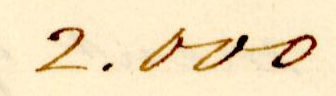2,000
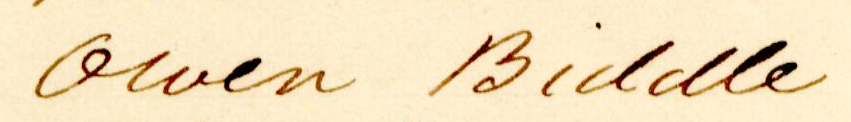Owen Biddle
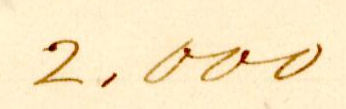2,000
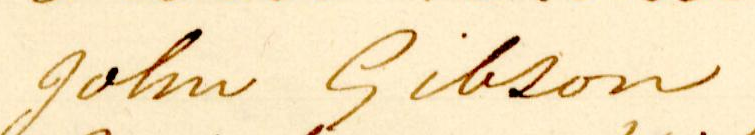John Gibson
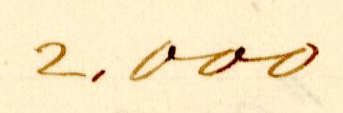2,000
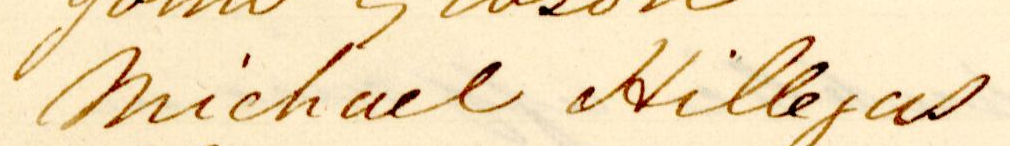Michael Hillegas
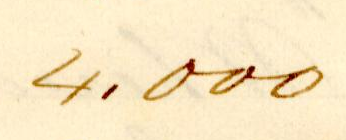4,000
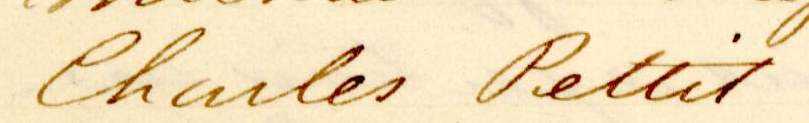Charles Pettit
